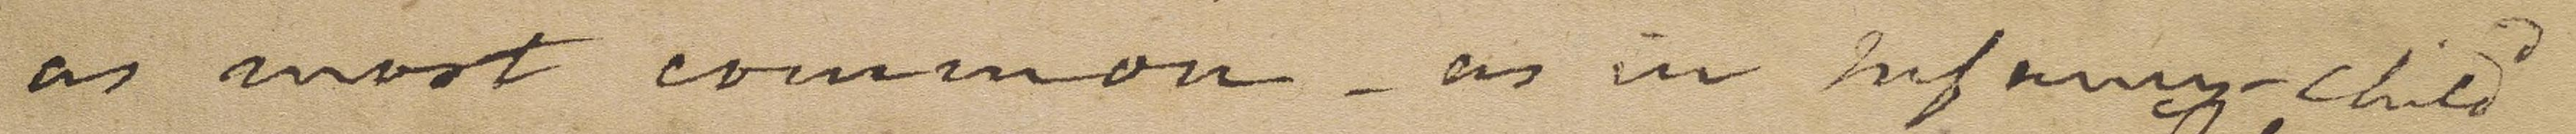as most common- as in Infancy- child^d
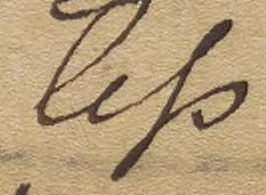less
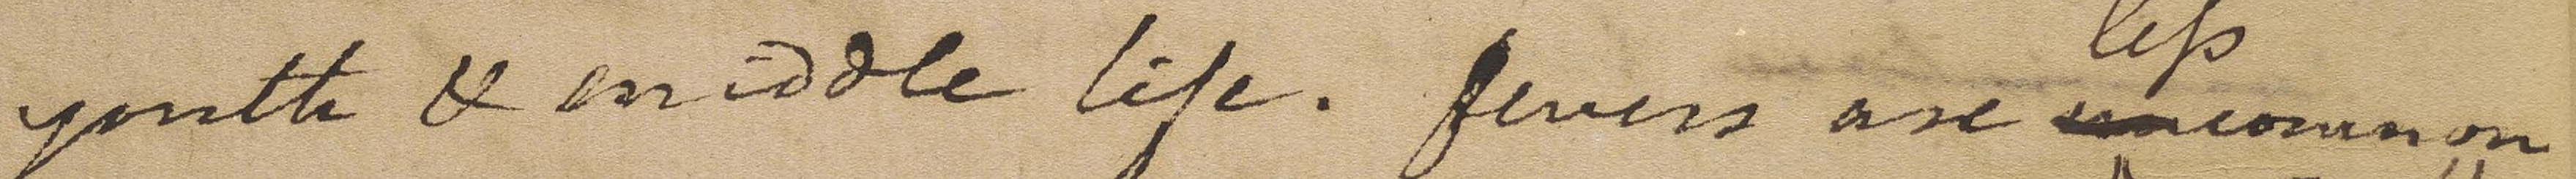youth & middle life. fevers are ^ common
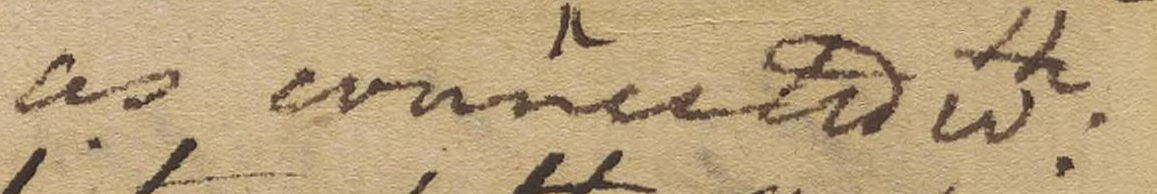as commenced w^th
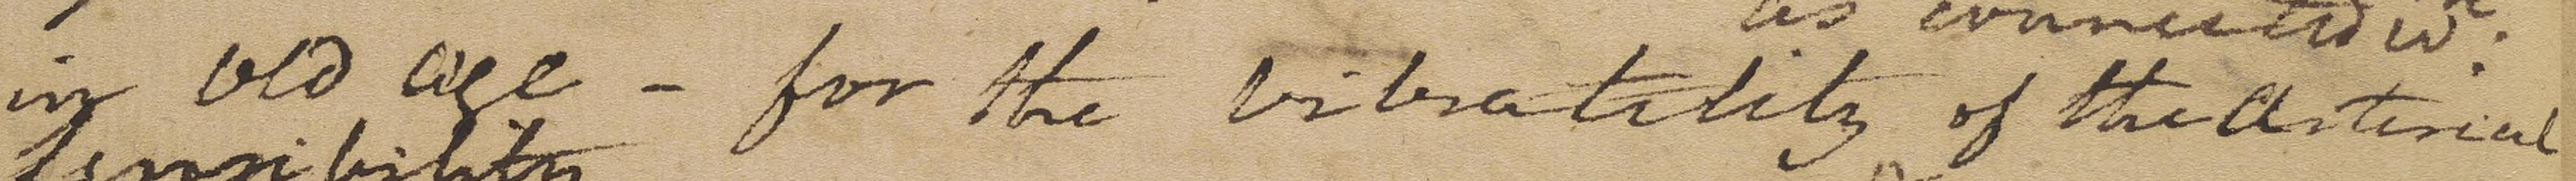in old age, for the vitality of the arterial
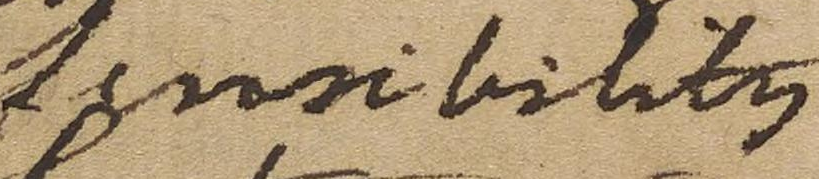sensibility
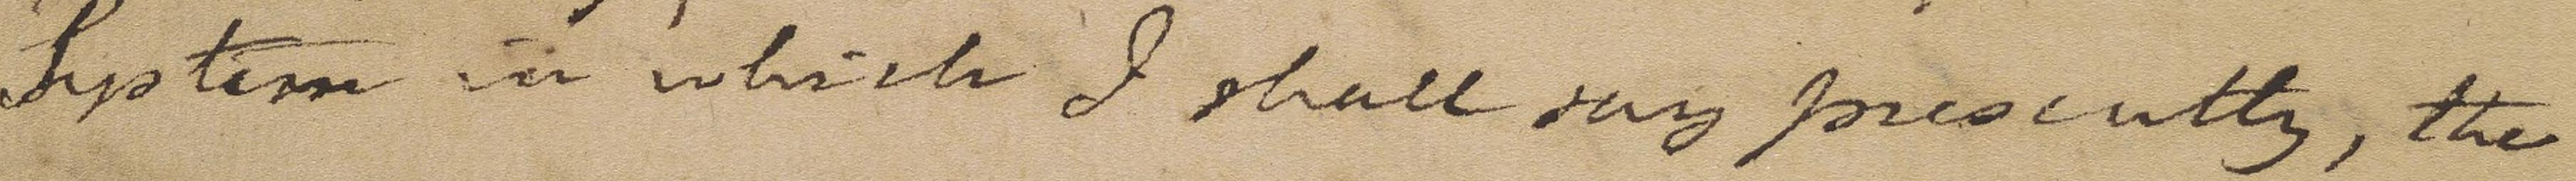system in which I shall say presently, the
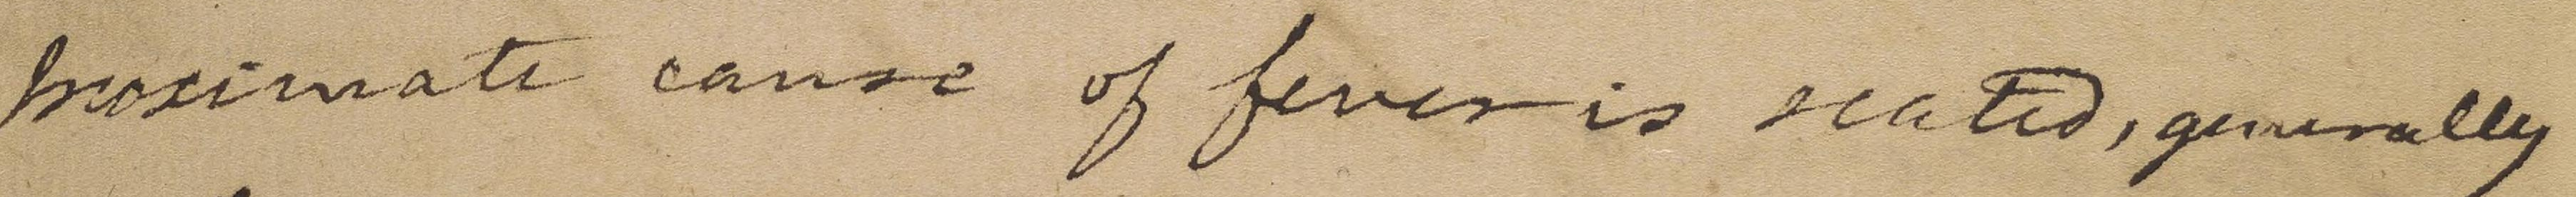proximate cause of fever is seated, generally
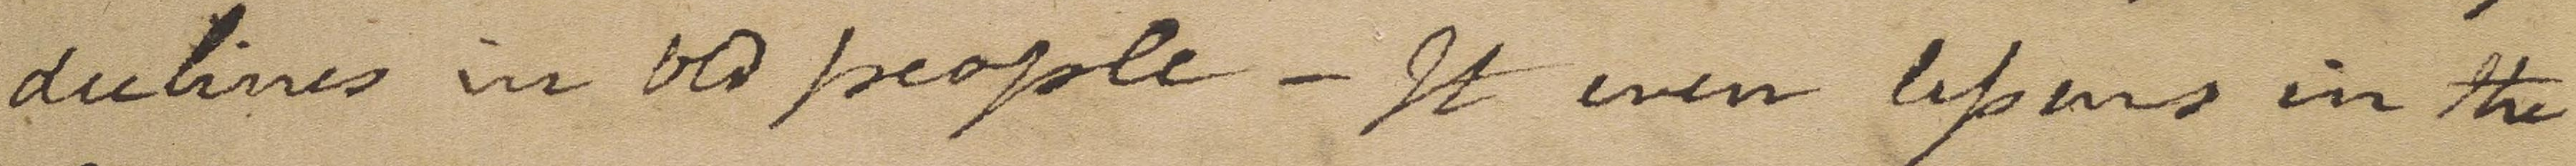declines in old people- It even opens in the
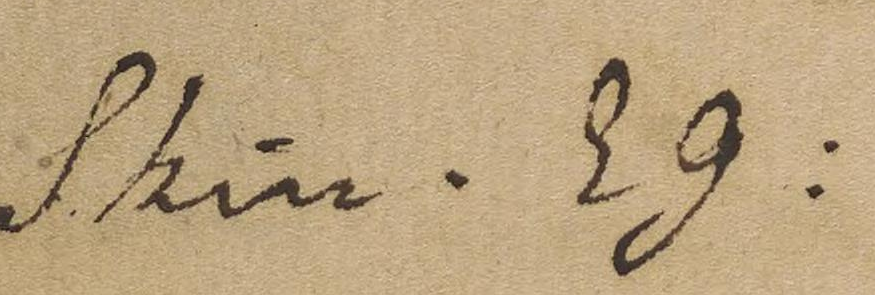skin. Eg:
